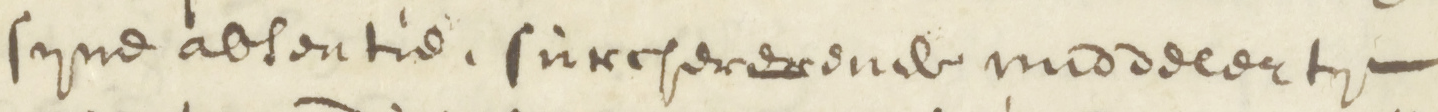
sijne absentie, surcherende middelertijt
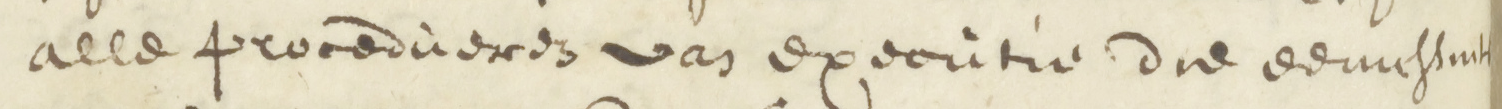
alle procedueren van executie die eenichsins
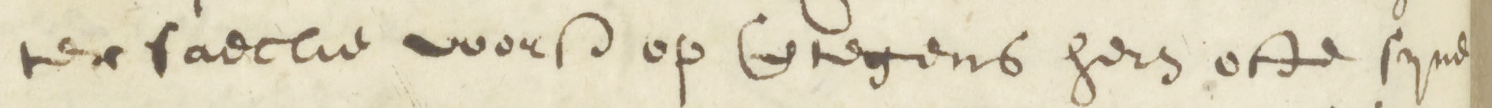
ter saecke voors. op & tegens hem ofte sijne
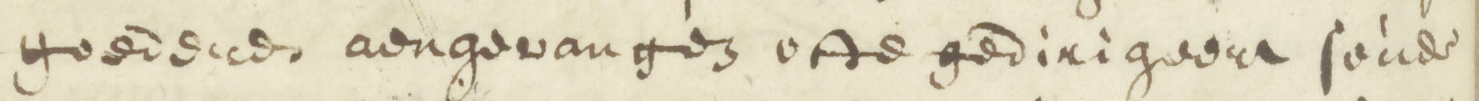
goederen aengevangen offe gedirigeert soude
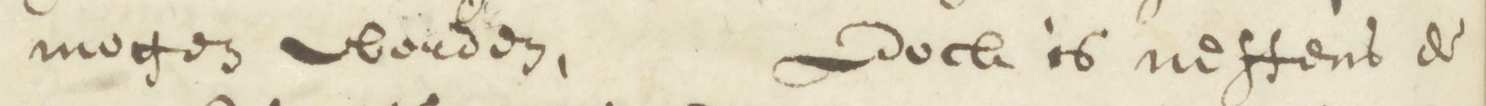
mogen worden. Oock is neffens de
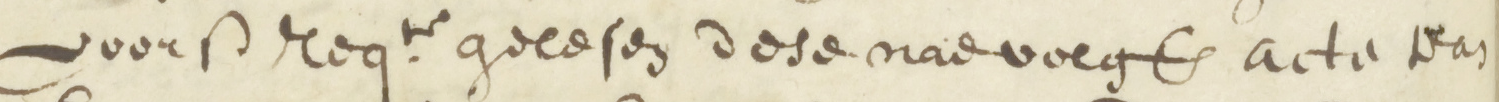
voors. reqte. gelesen dese naevolg acte van
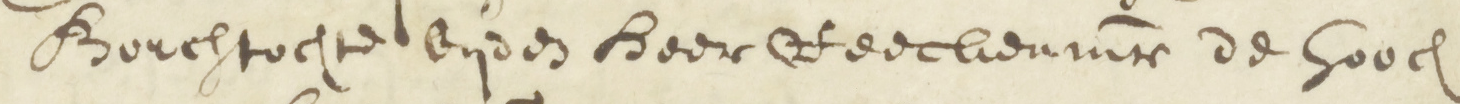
Borchtochte bij den heer Reeckenmr Hooch
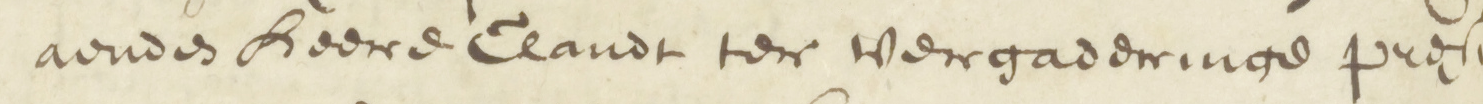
aenden heere Clandt ter vergaderinge presi,,
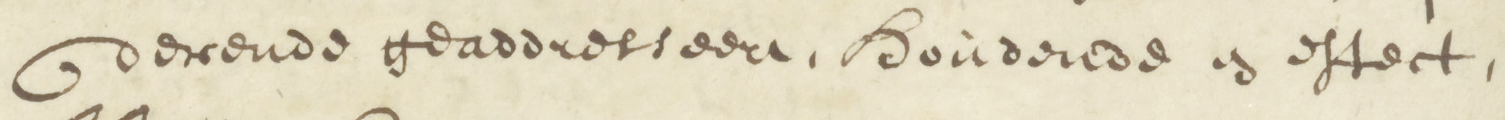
derende geaddresseert, houdende in effect,
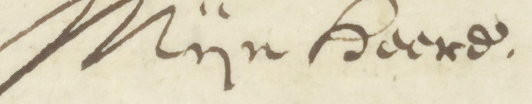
Mijn heere.
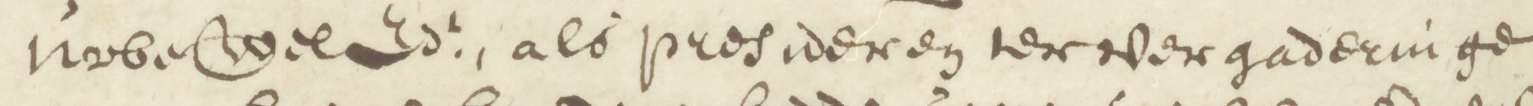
Uwe wel Ed. als presideren ter vergaderinge
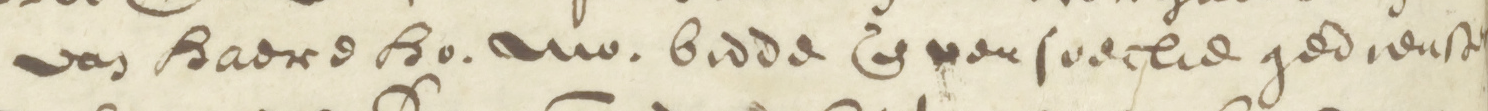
van haere ho:mo: bidde & versoecke gedienst
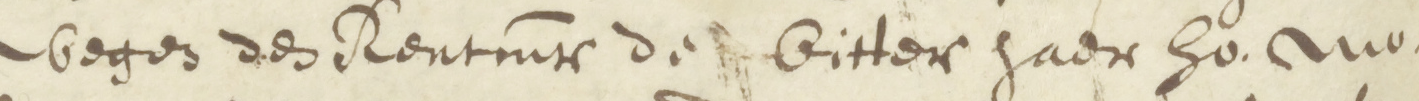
wegen des Rentmr de bitter haer Ho:Mo:
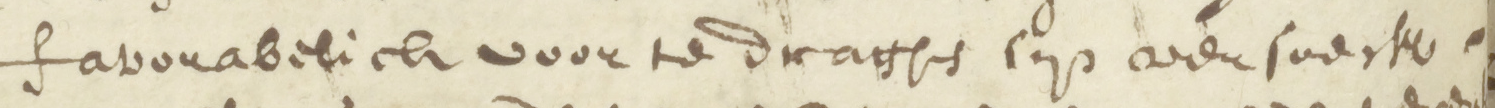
favorabelick voor te draghen sijn aensoeck
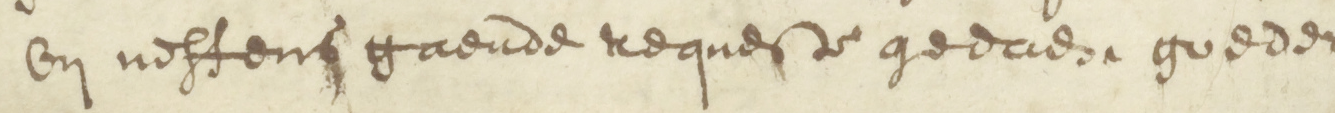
bij neffens gaende requeste gedaen goedertieren
